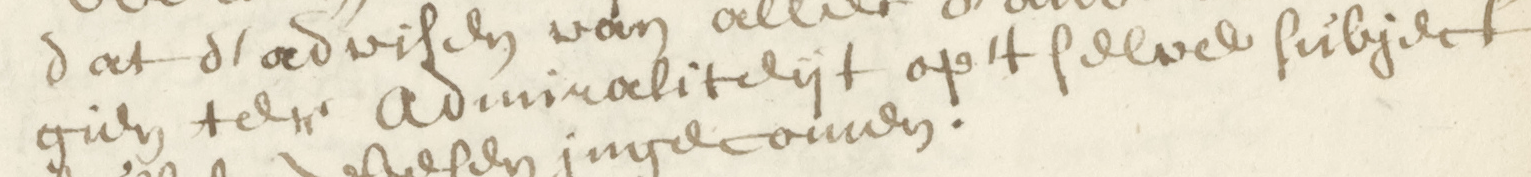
gien ter Admiraliteijt op't selve subject
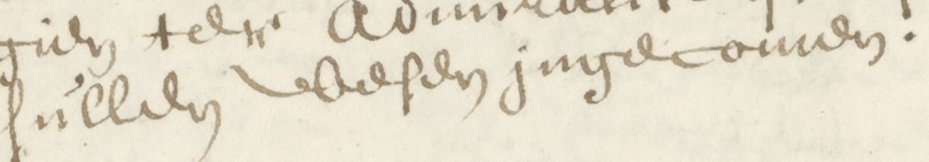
sullen wesen ingecomen.
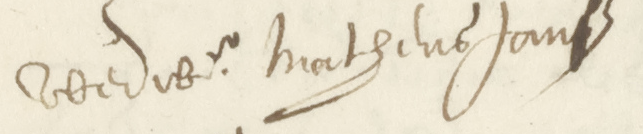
Wedwe. Matheus Jans
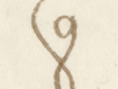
ca
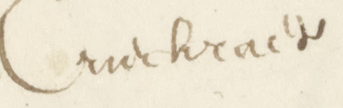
Crieckraet
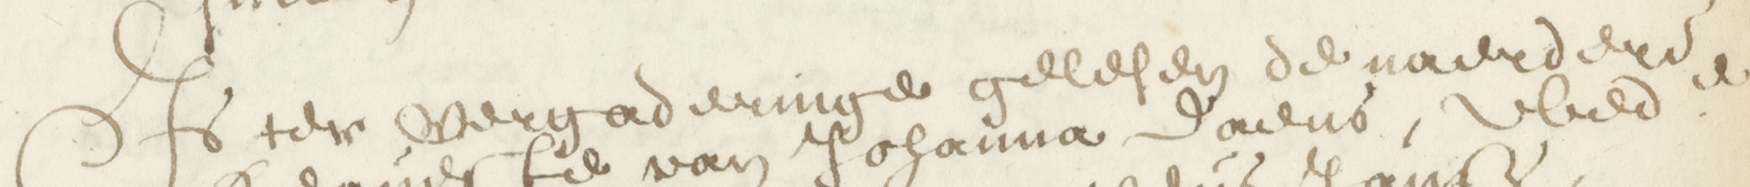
Is ter vergaderinge gelesen de naerdere
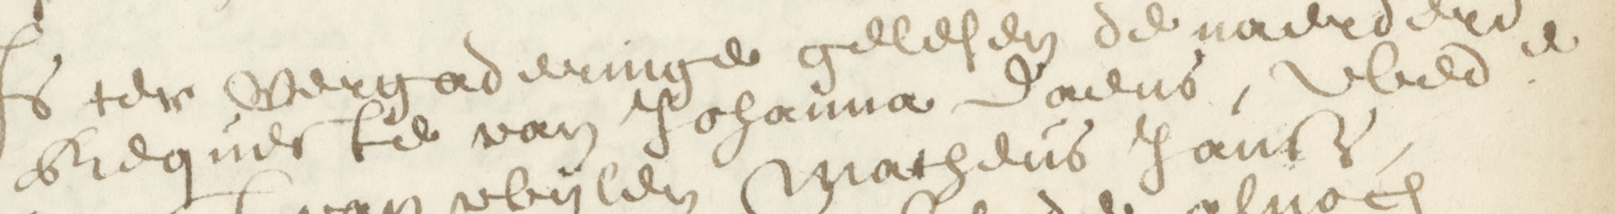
Requeste van Johanna Daens, wede.
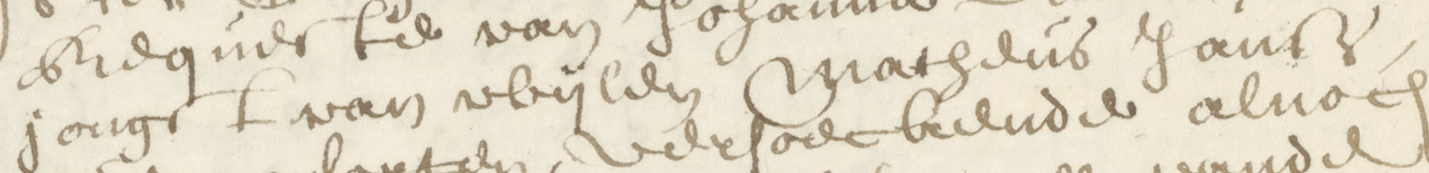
jongst van wijlen Matheus Jans,
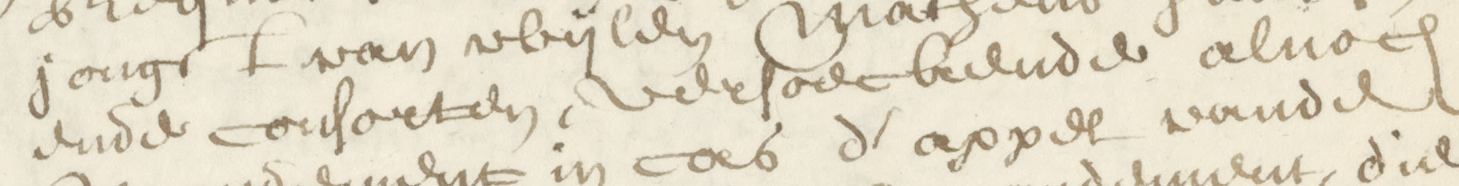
ende consorten, versoeckende alnoch
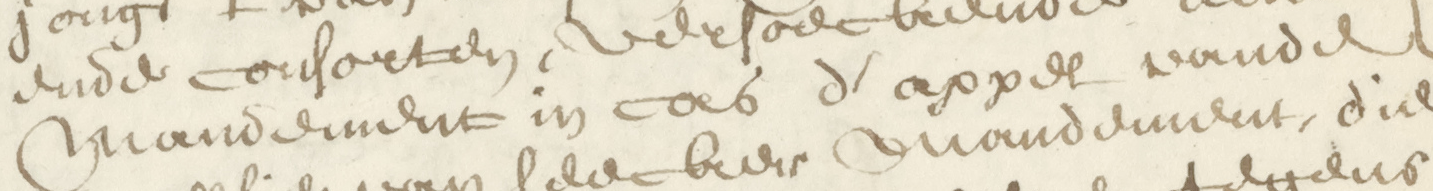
mandement in cas d'appel vande
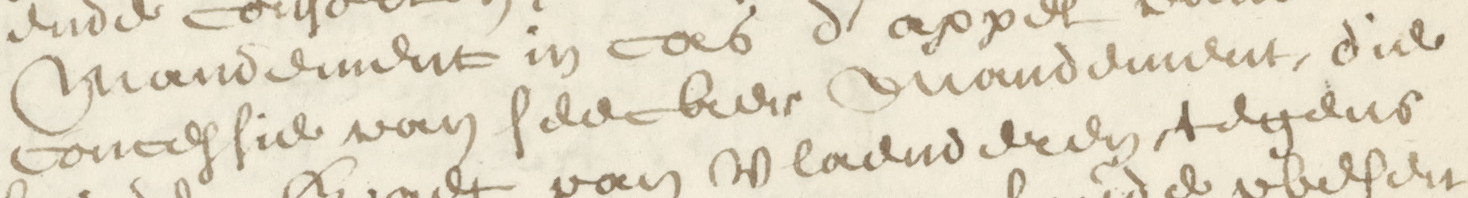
concessie van seecker mandement, die
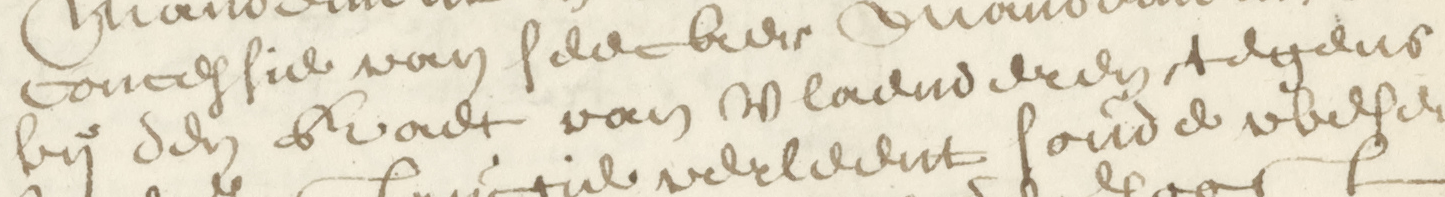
bij den Raet van Vlaenderen, tegens
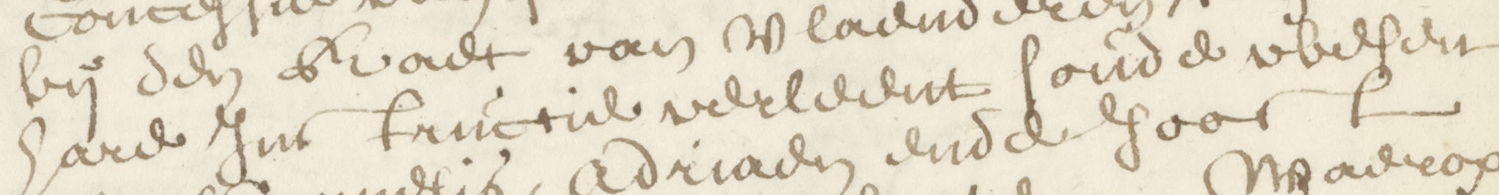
hare Instructie verleent soude wesen
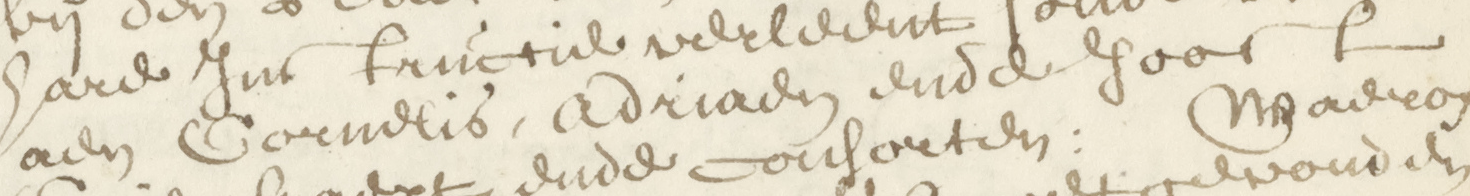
aen Cornelis, Adriaen ende Joost
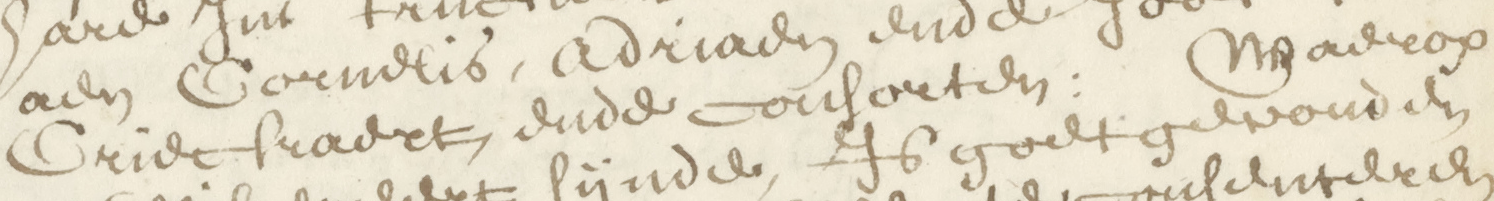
Crieckaert, ende consorten: Waerop
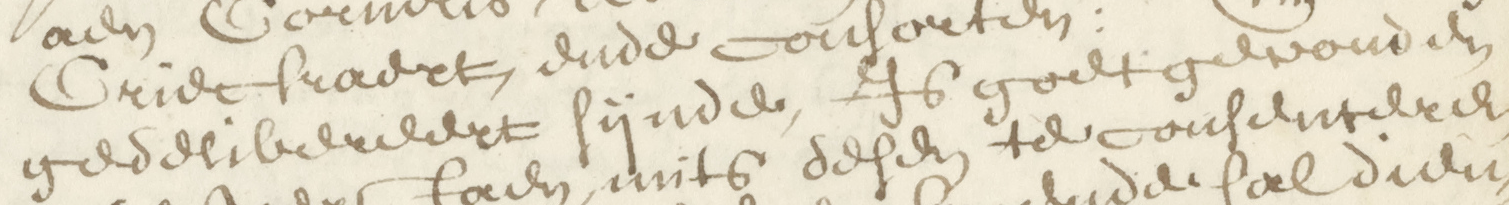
gedelibereert sijnde, Is goetgevonden
